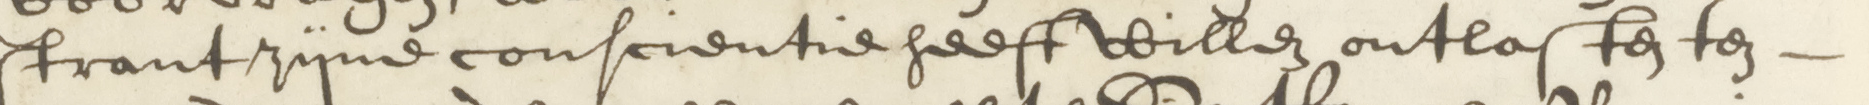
strant zijne conscientie heeft willen ontlasten ten —
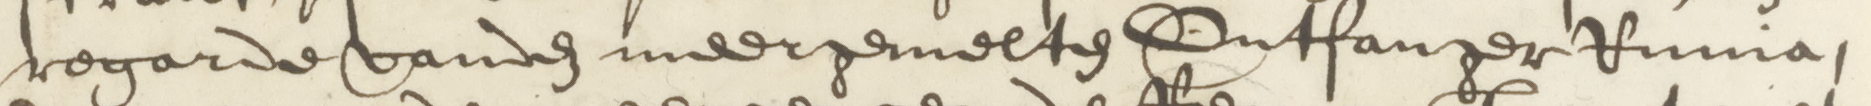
regarde vanden meergemelten Ontfanger Runia,
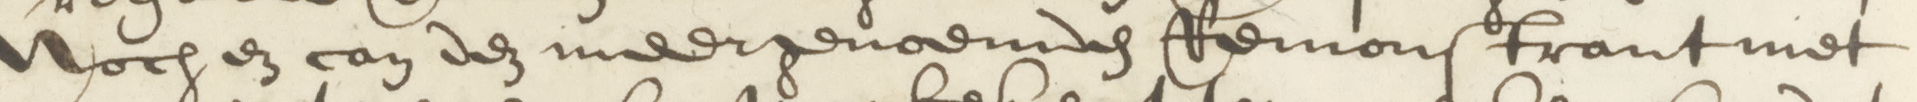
Noch en can den meergenoemden Remonstrant niet
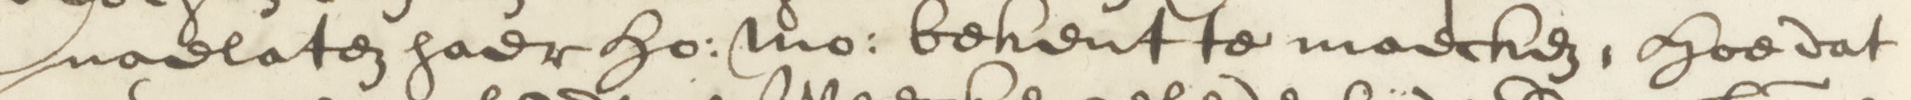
naelaten haer Ho:Mo: bekent te maecken, hoe dat
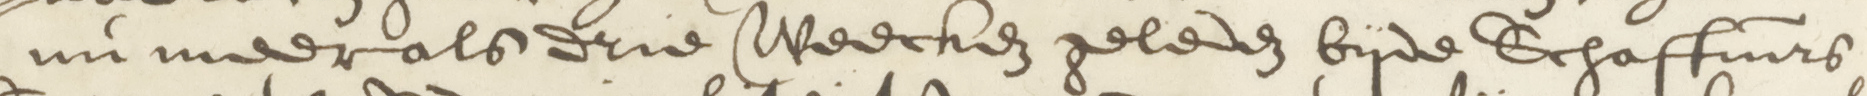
nu meer als drie Weecken geleden bijde Schaftmrs
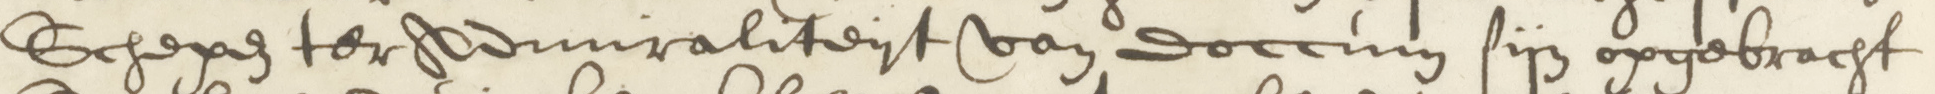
Schepen ter Admiraliteijt van doccum sijn opgebracht
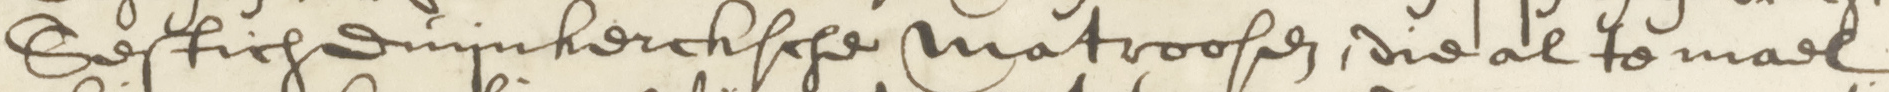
Sestich duijnkercksche matroosen, die al te mael
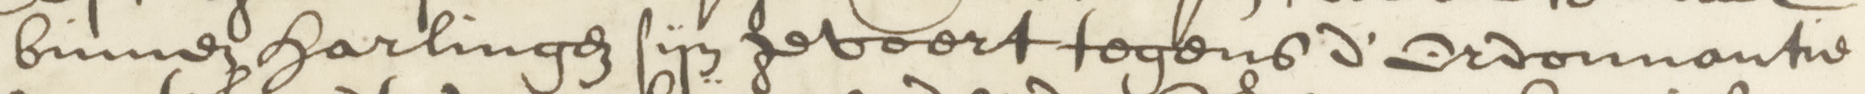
binnen Harlingen sijn gevoert tegens d'Ordonnantie
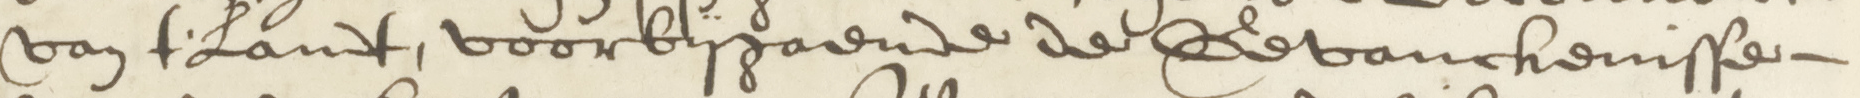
van t'Lant, voorbijgaende de Gevanckenisse —
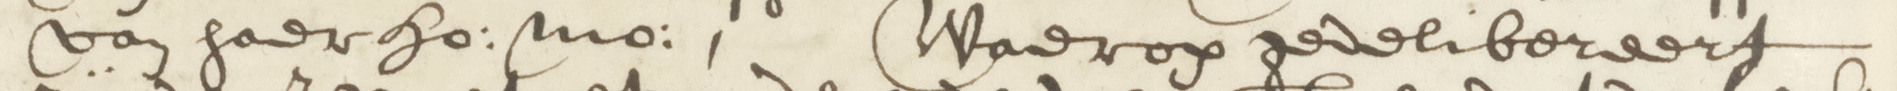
van haer Ho:Mo:.Waerop gedelibereert
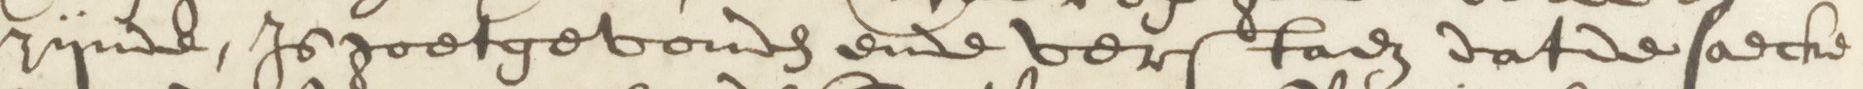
zijnde, Is goetgevonden ende verstaen dat de saecke
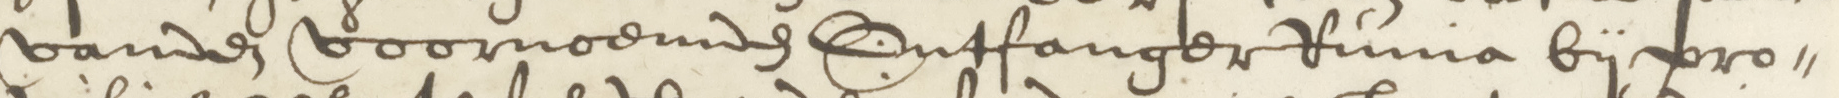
vanden voornoemden Ontfanger Runia bij pro„
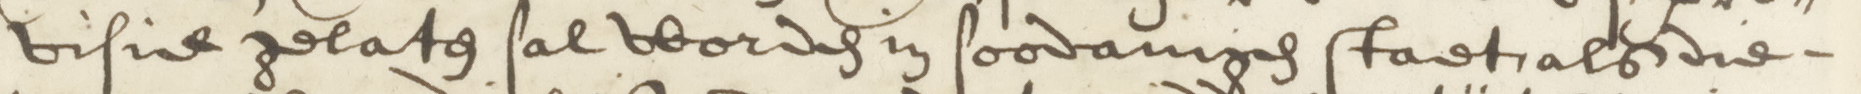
visie gelaten sal worden in soodanigen staet als die -
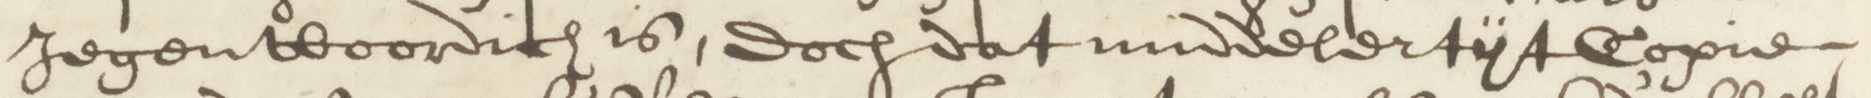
Jegenwoordich is, doch dat middelertijt Copie ¬
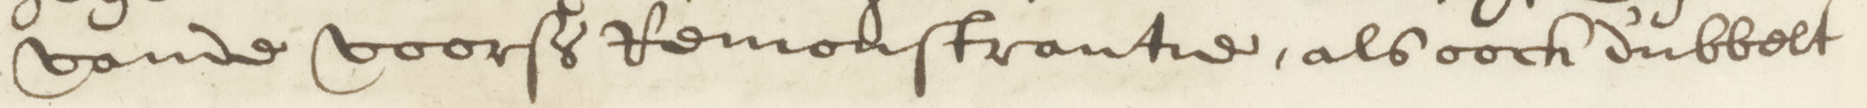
vande voorsz Remonstrantie, als oock dubbelt
